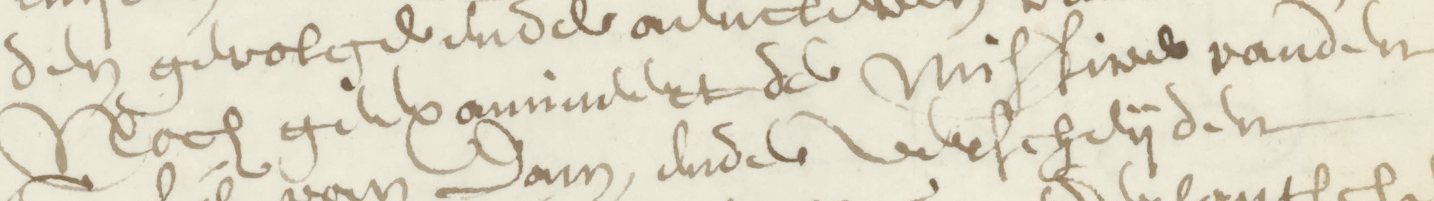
Noch geexamineert de missive vanden
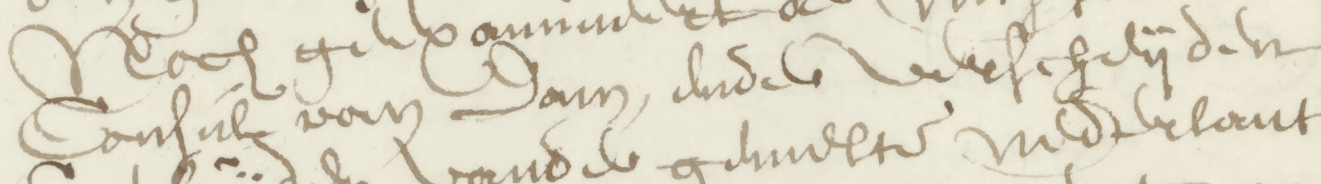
Consul van Dam, ende verscheijden
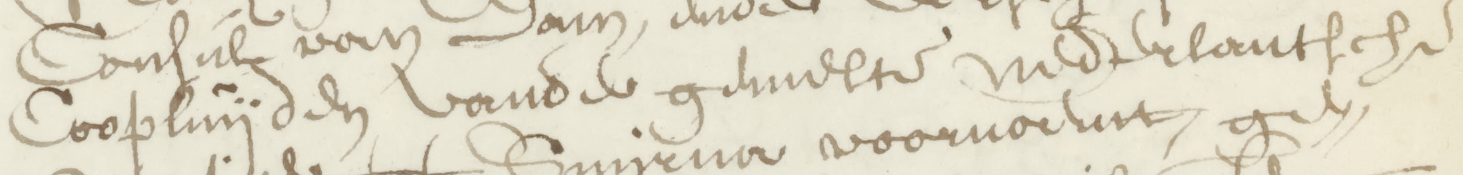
Coopluijden vande gemelte Nederlantsche
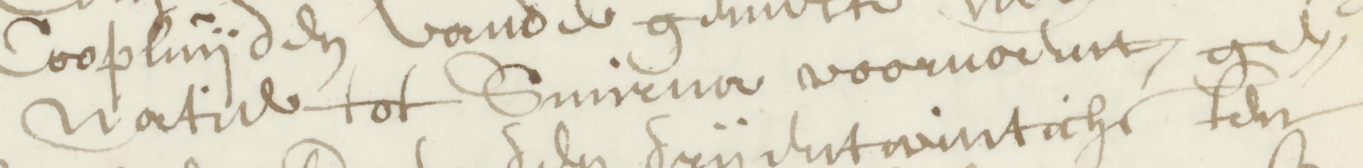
natie tot Smirna voornoemt, ge„
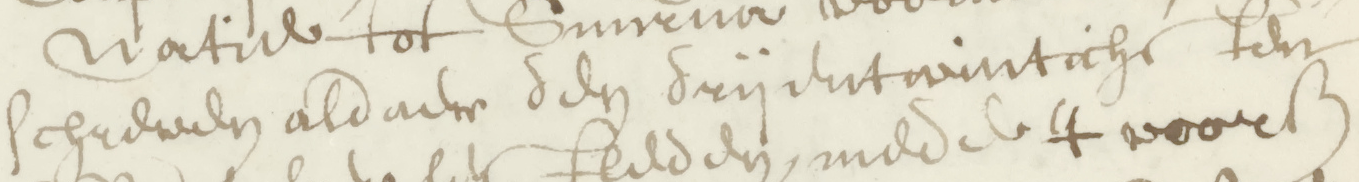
schreven aldaer den drijentwintichsten
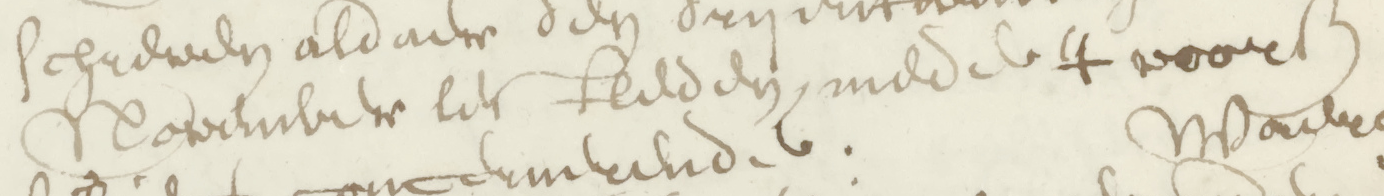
November lestleden, mede 't voors
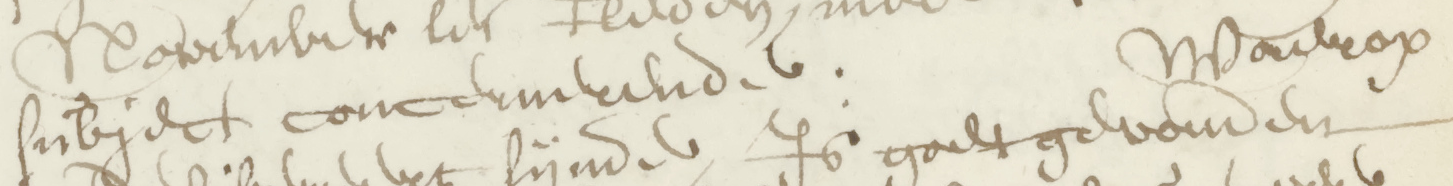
subject concernerende: Waerop
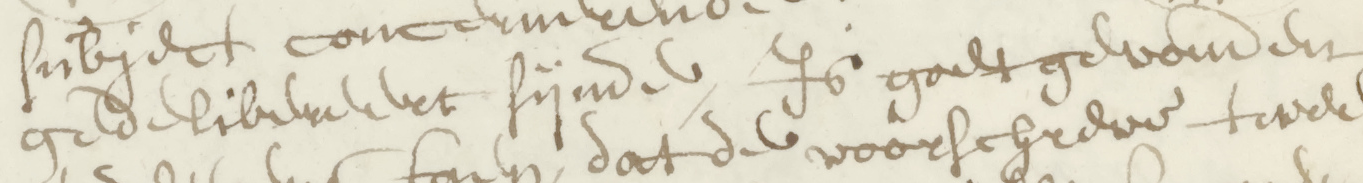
gedelibereert sijnde, Is goetgevonden
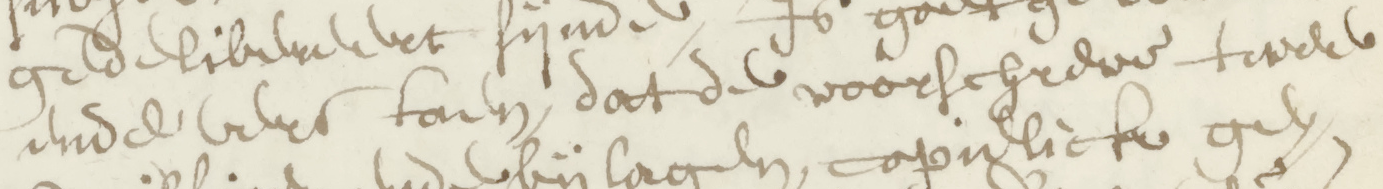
ende verstaen, dat de voorschreve twee
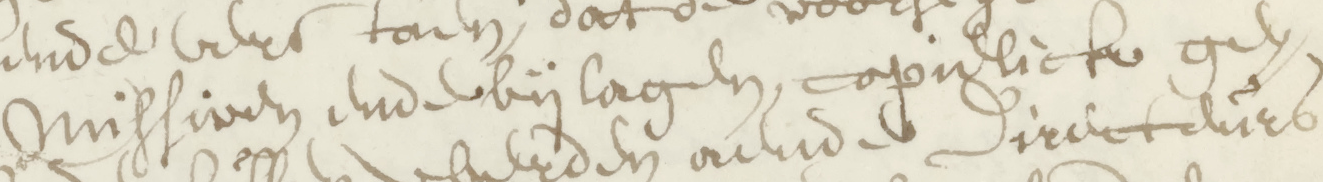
missiven ende bijlagen, copielick ge„
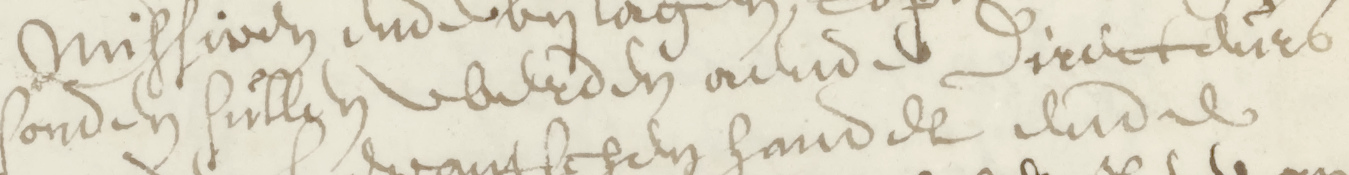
sonden sullen werden aende Directeurs
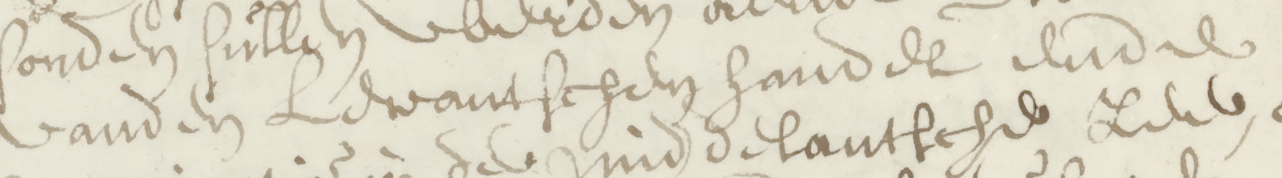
vanden Levantschen handel ende
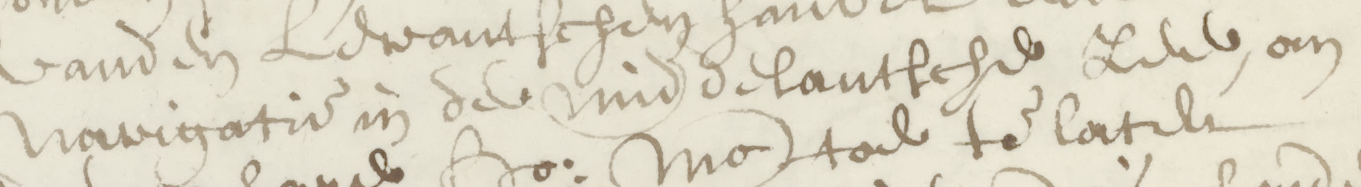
navigatie in de middelantsche zee, om
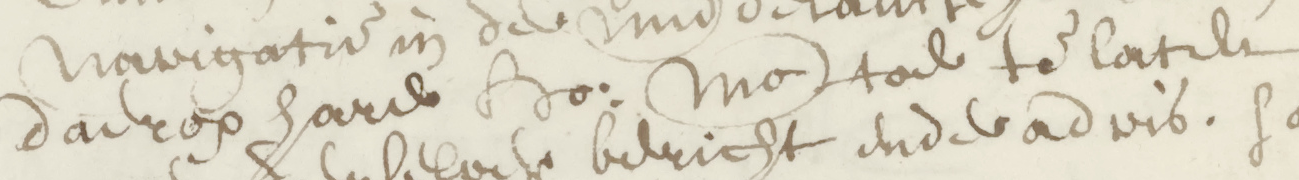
daerop hare Ho:Mo: toe te laten
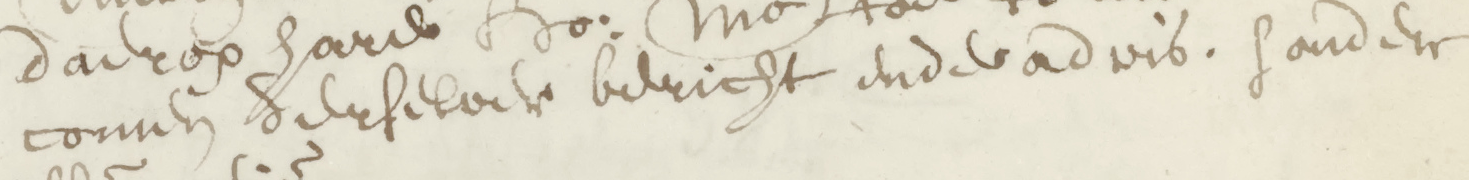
comen derselver bericht ende advis. sonder
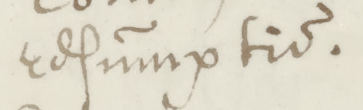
resumptie.
